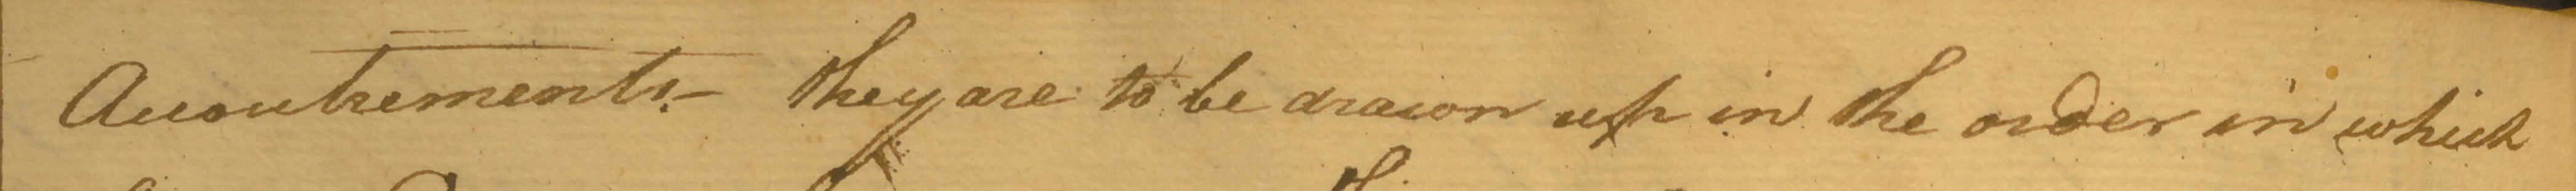Accoutrements- they are to be drawn up in the order in which
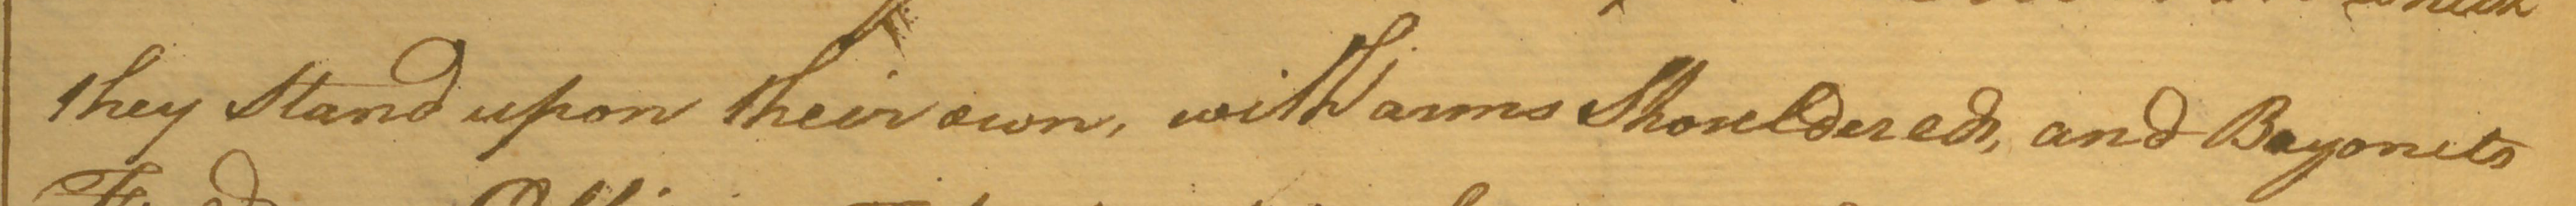they Stand upon their own, with arms Shouldered and Bayonets
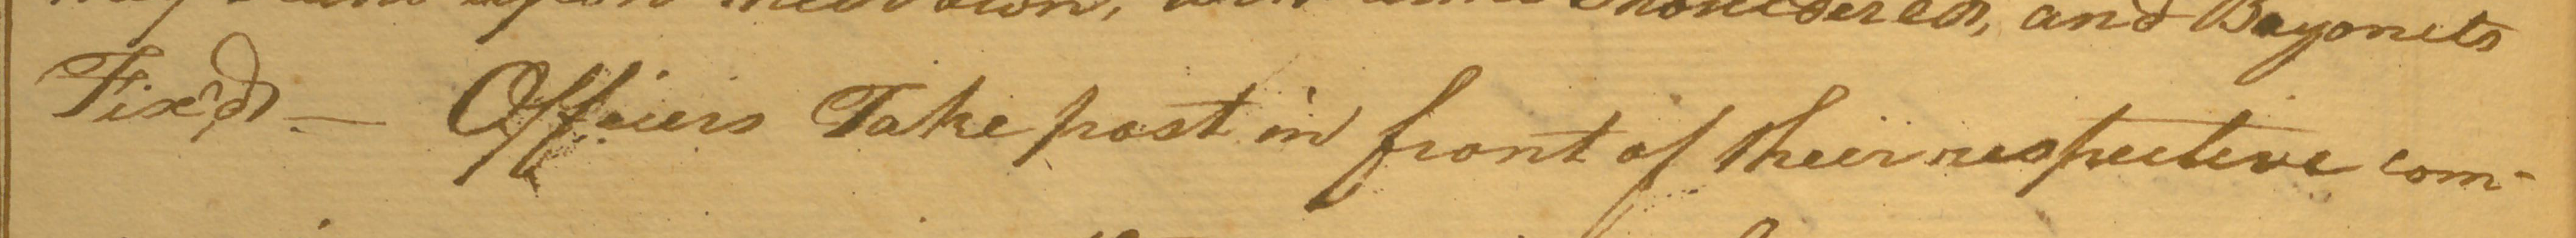Fix'd- Officers Take post in front of their respective com-
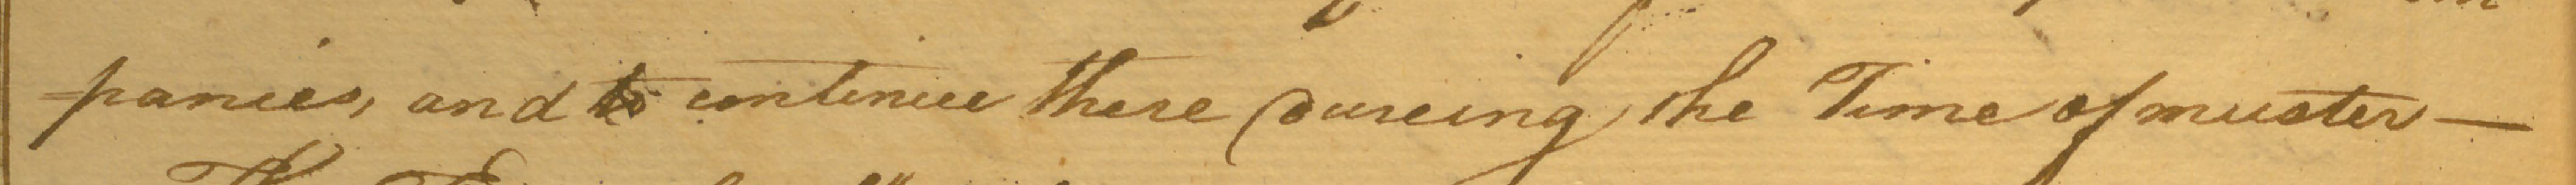-panies, and [__] continue there during the Time of muster-
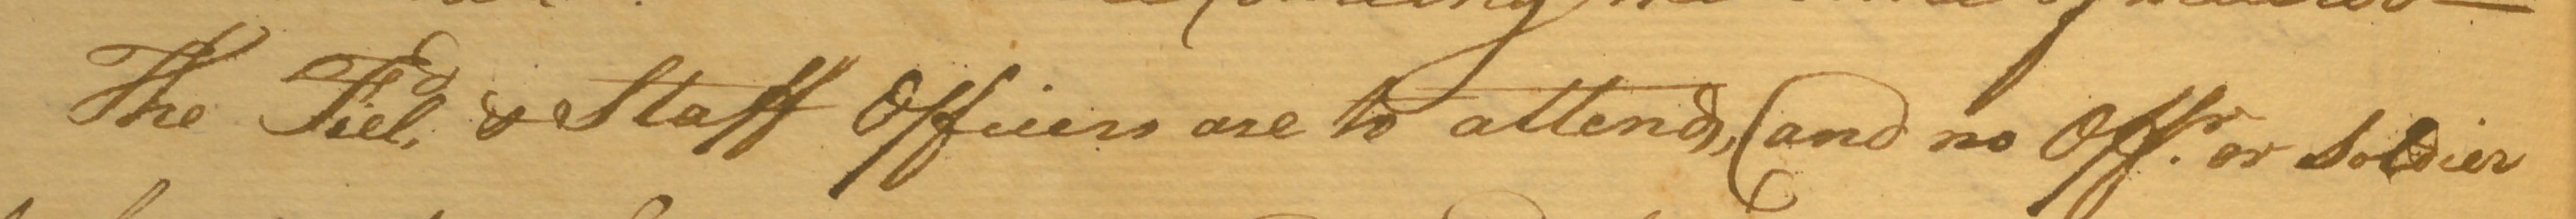The Fiel^d & Staff Officers are to attend, and no Off^r. or Soldier
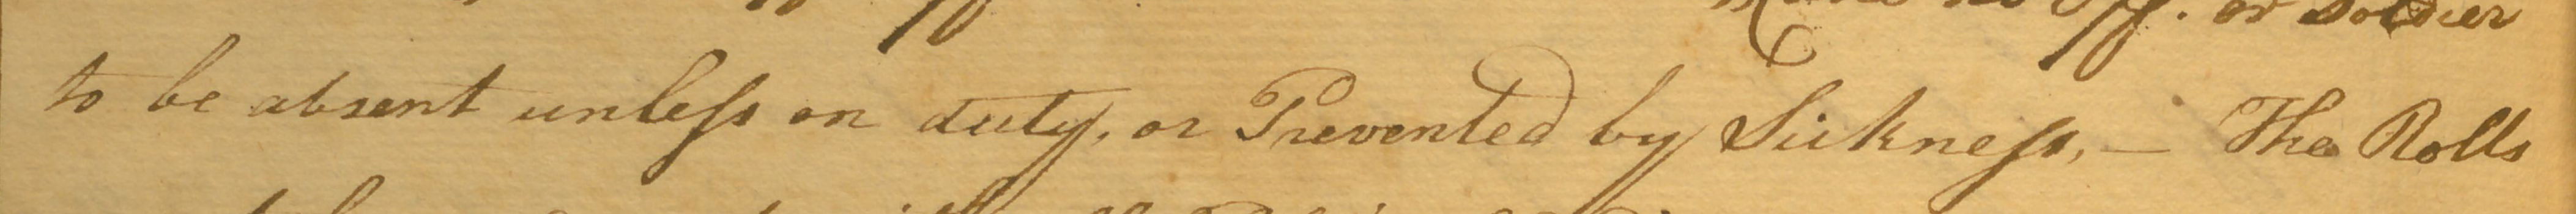to be absent unless on duty, or Prevented by Sickness- The Rolls
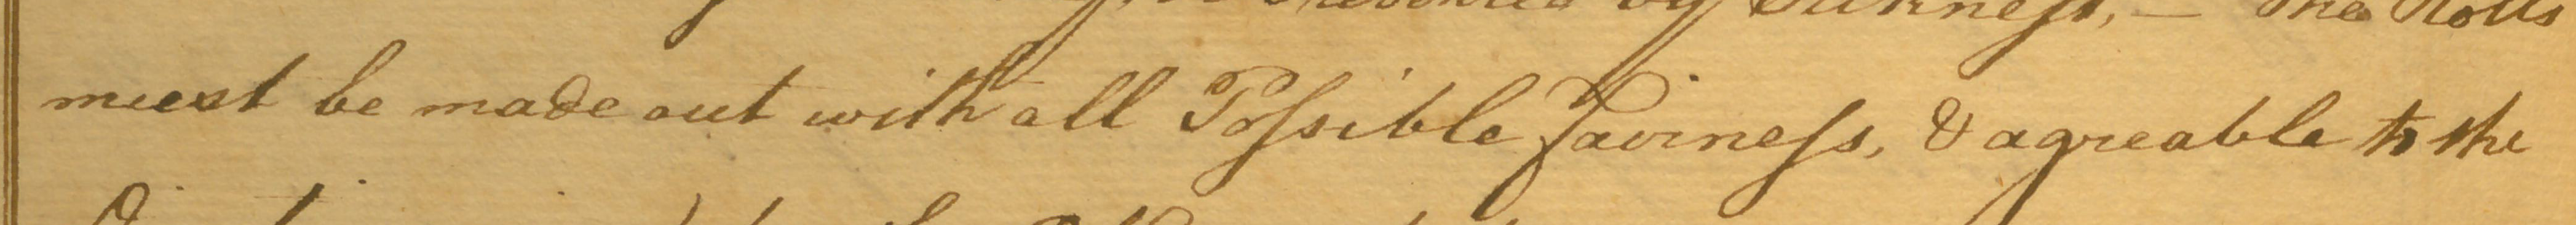must be made out with all Possible fairness, & agreable to the
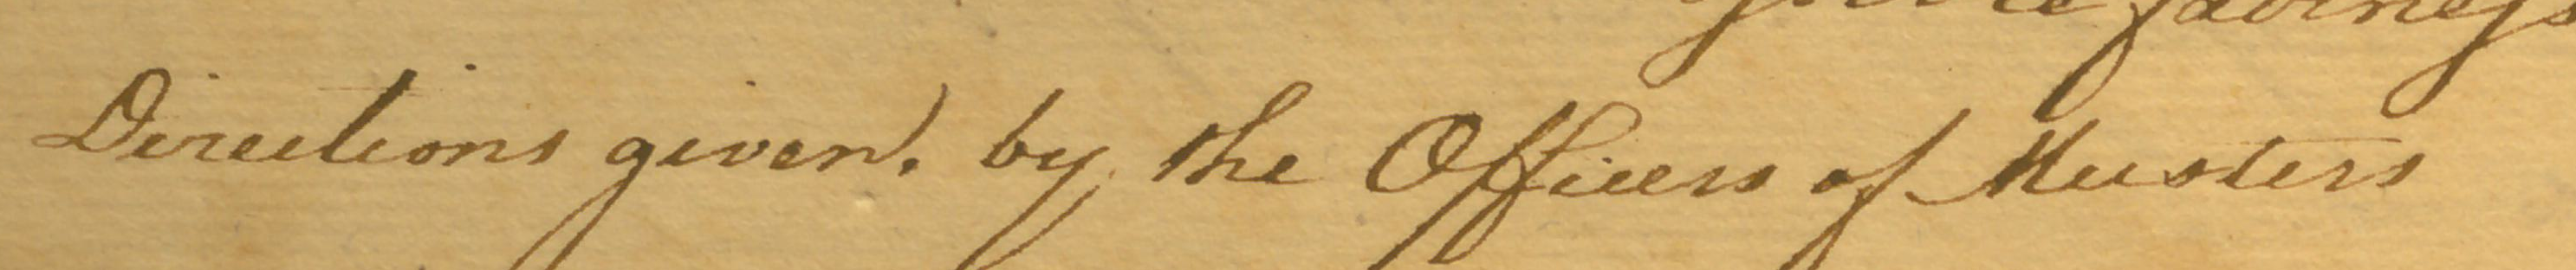Directions given by the Officers of Musters
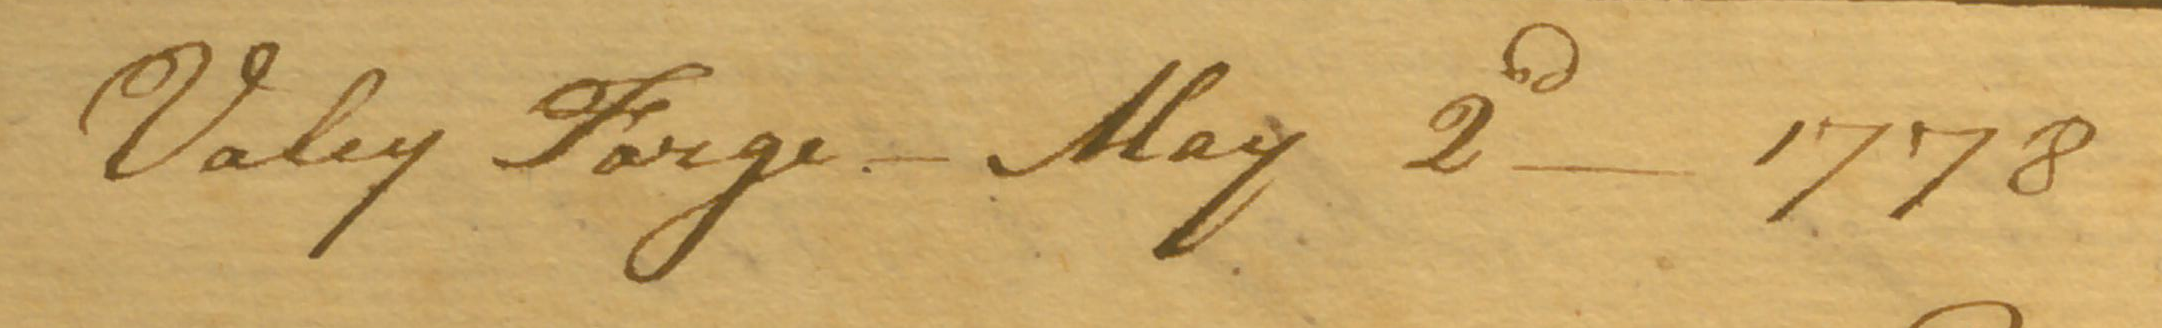Valey Forge- May 2^d.- 1778
